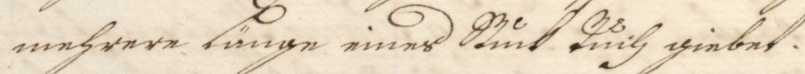mehrere Länge eines Stuck Tuch giebet.
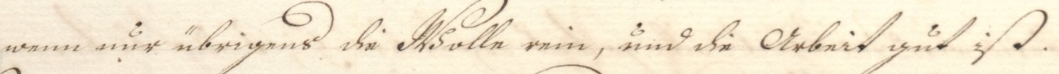wenn nur übrigens die Wolle rein, und die Arbeit gut ist.
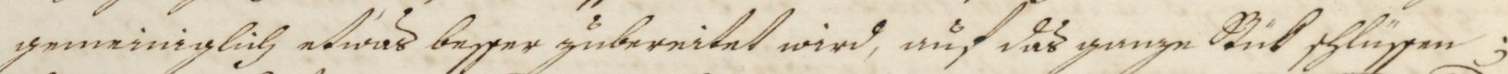gemeiniglich etwas besser zubereitet wird, auf das ganze Stük schlüssen;
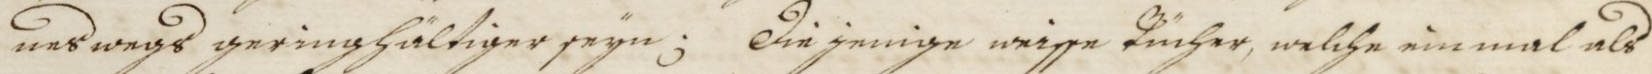nes wegs geringhältiger seyn. Die jenige weisse Tücher, welche einmal als
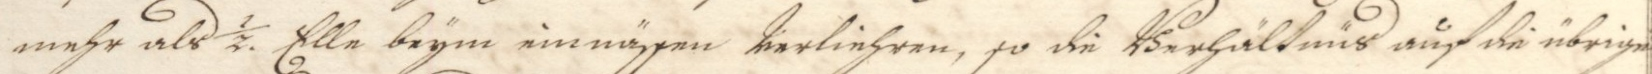mehr als 1/2. Elle beym einnässen verliehren, so die Verhältnüs auf die übrige
